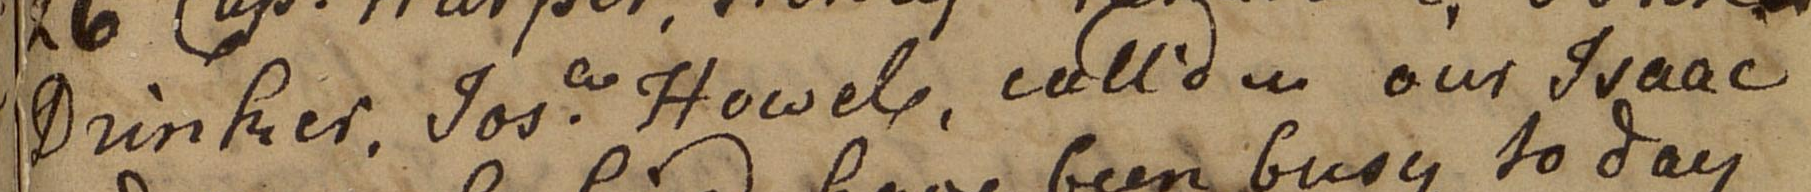Drinker, Jos^a. Howel, call'd an our Isaac
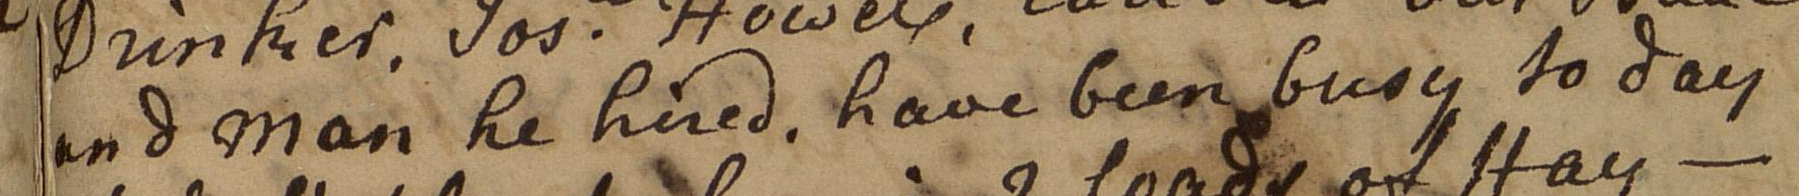and man he hired, have been busy to day
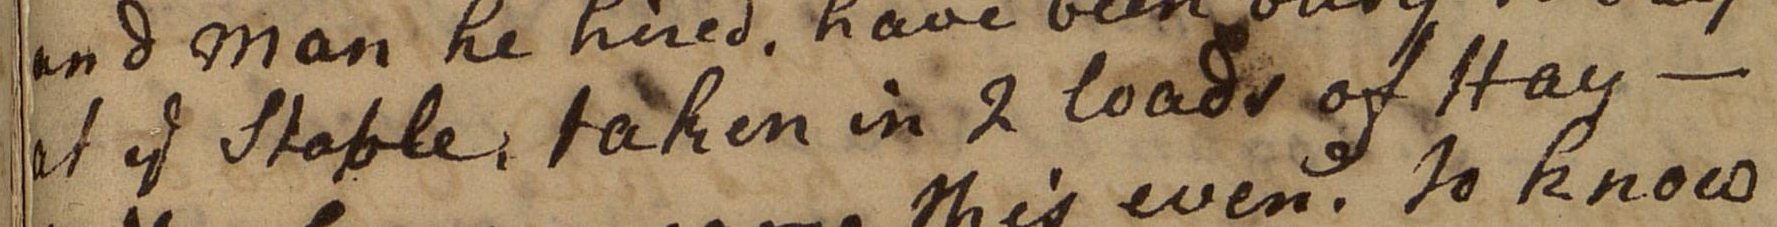at y^e Stable, taken in 2 loads of Hay-
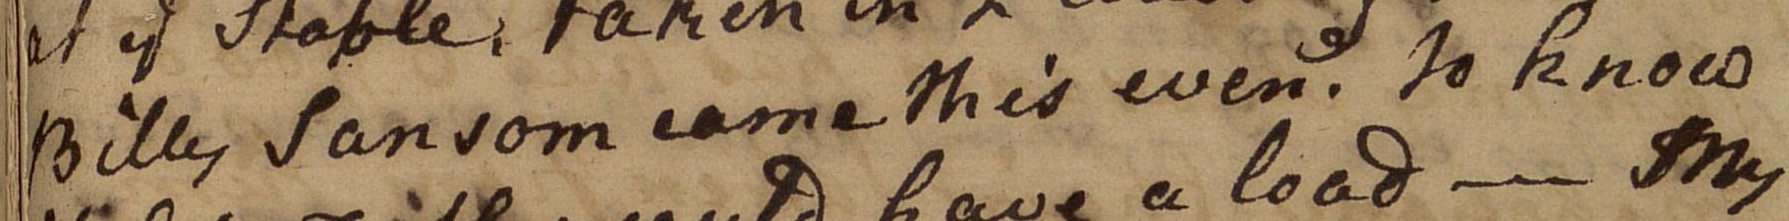Billy Sansom came this even^g. to know
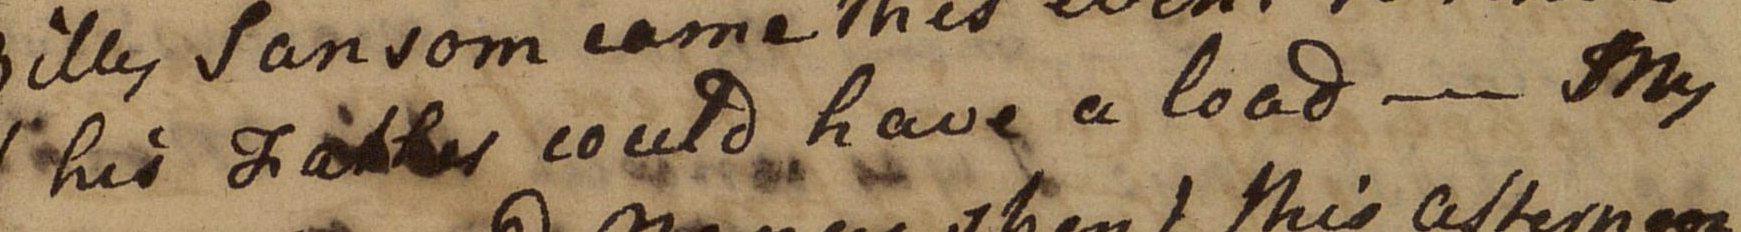if his Father could have a load- My
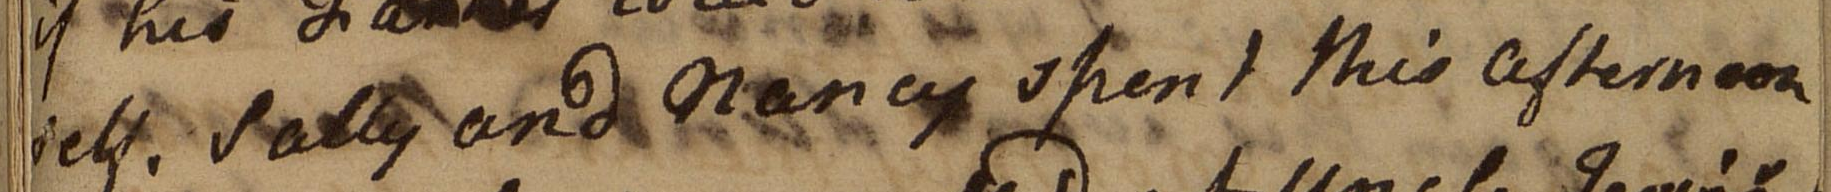self, Sally and Nancy spent this Afternoon
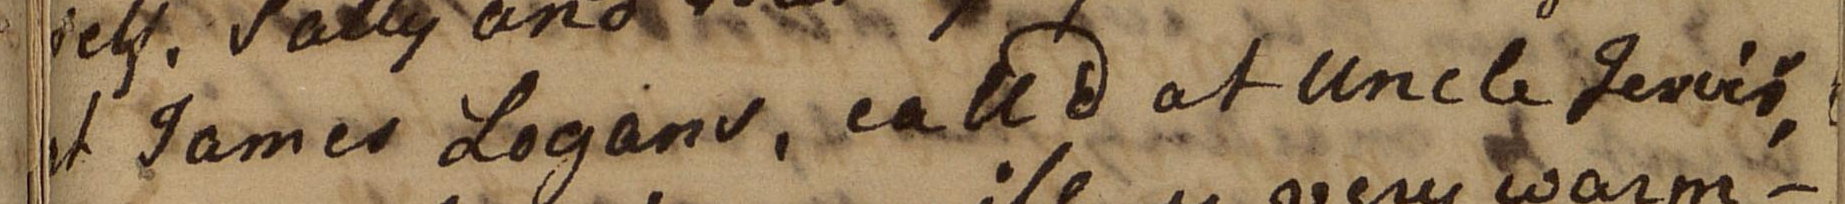at James Logans, call'd at Uncle Jervis's
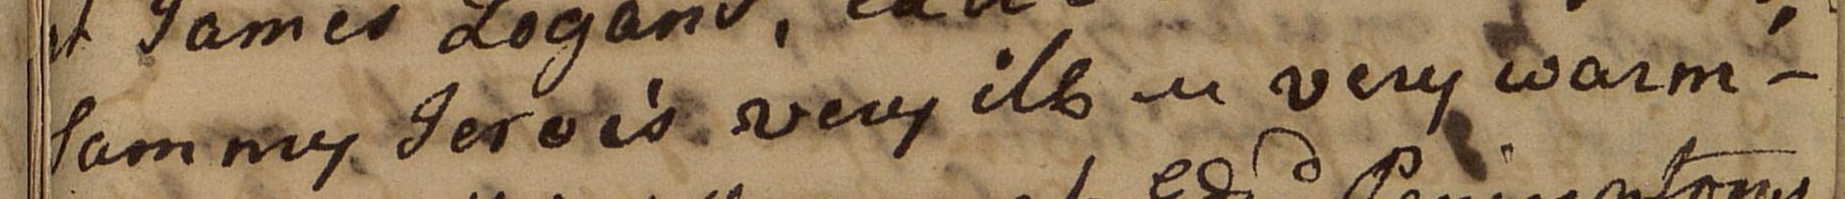I am my Jervis very ill- very warm-
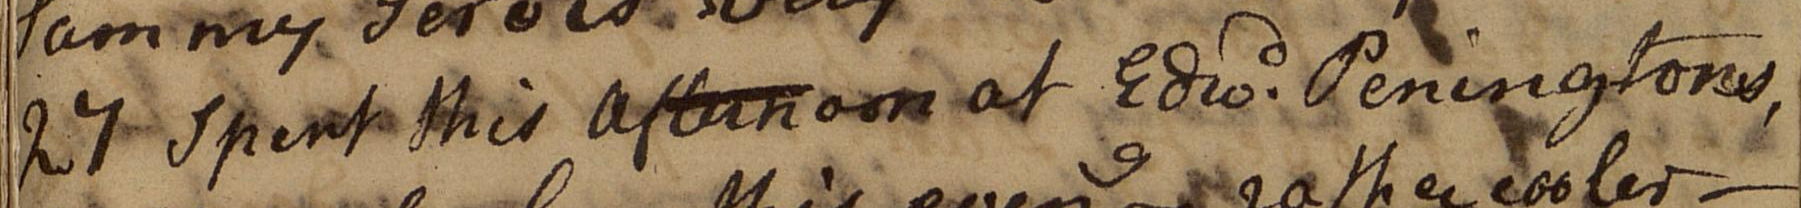27 spent this afternoon at Edw^d. Peningtons,
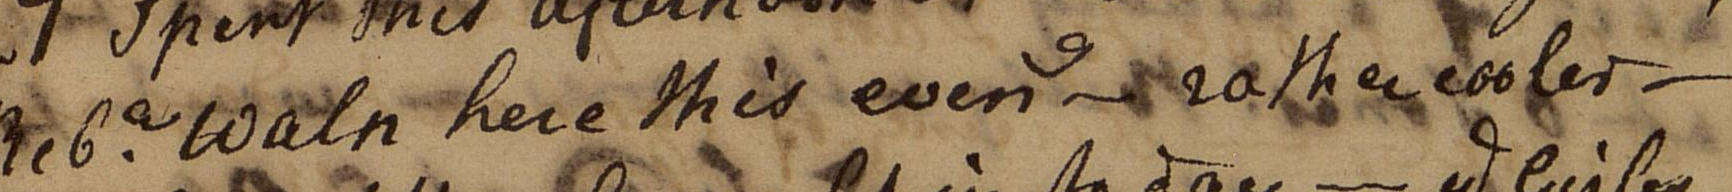Reb^a. Waln here this even^g- rather cooler-
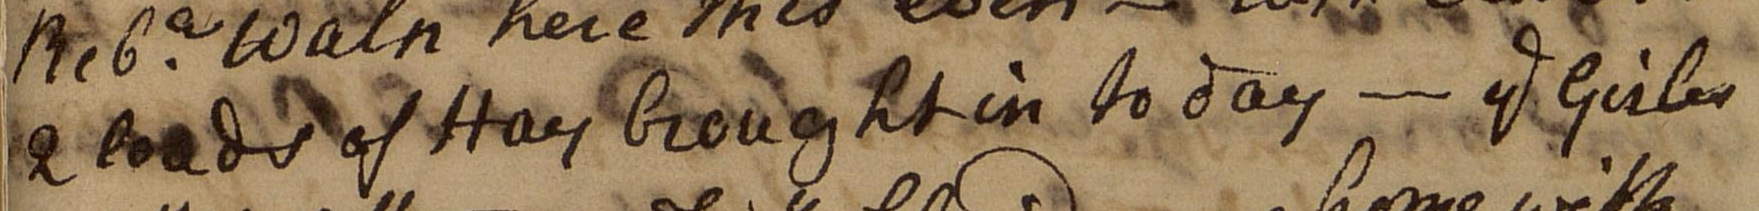2 loads of Hay brought in to day- y^e Girles
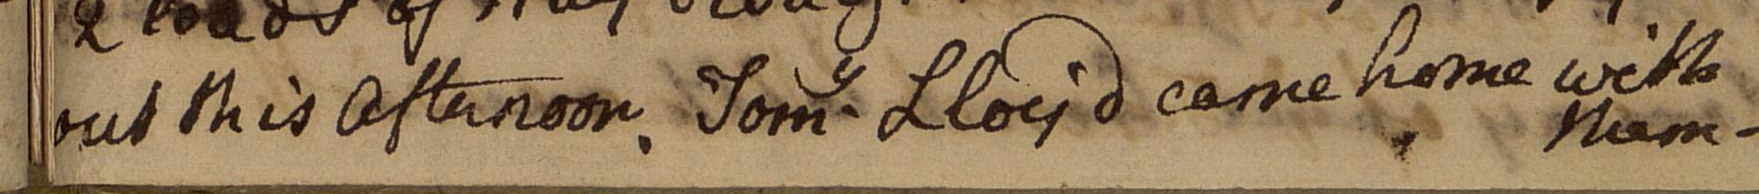out this Afternoon Tom.^y Lloy'd came home with
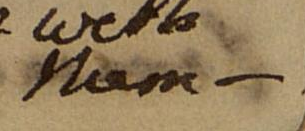them-
